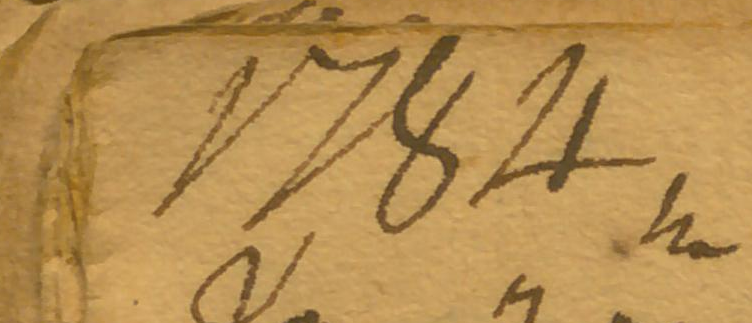1784
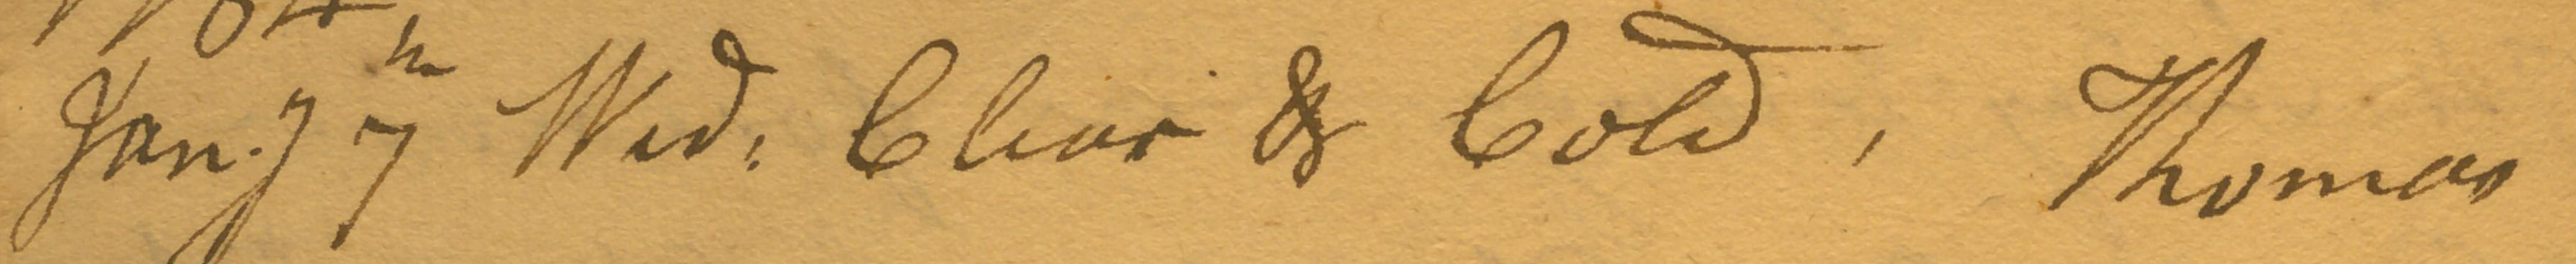Jan^y. 7 Wed. Clear & Cold, Thomas
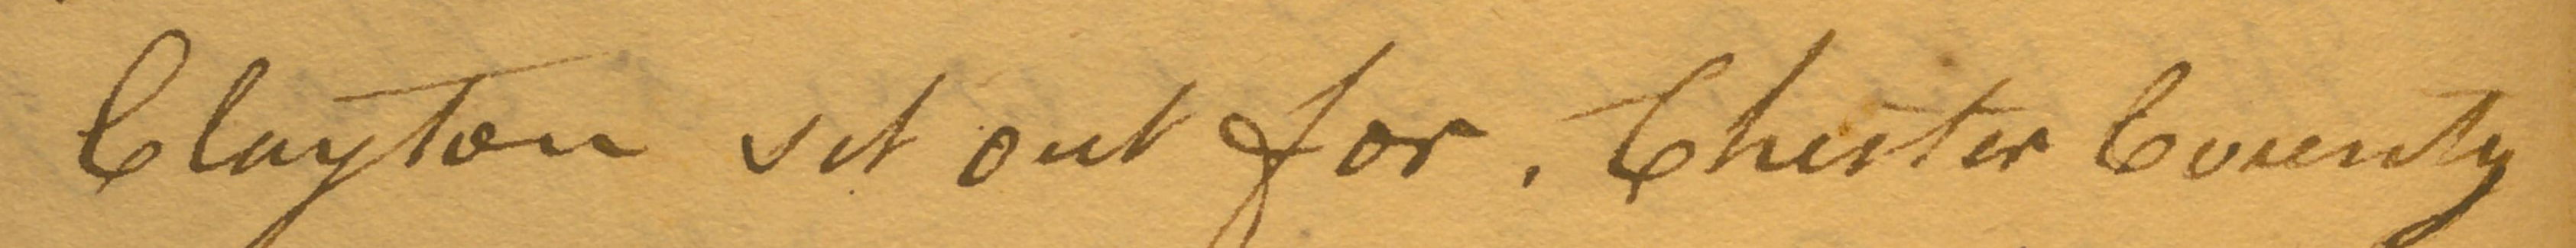Clayton set out for Chester County
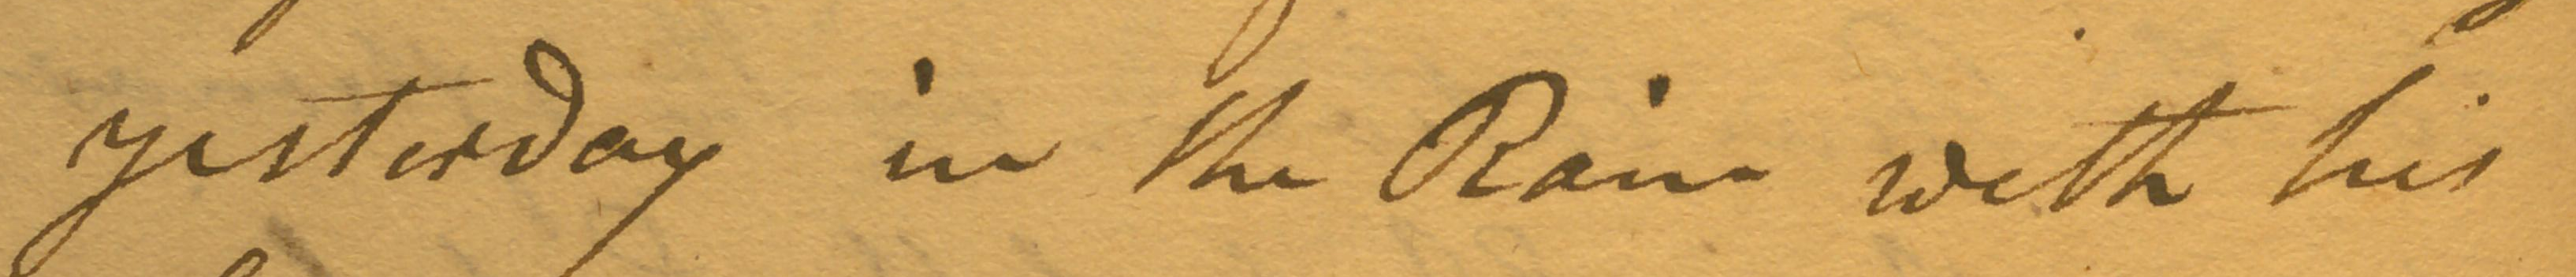yesterday in the Rain with his
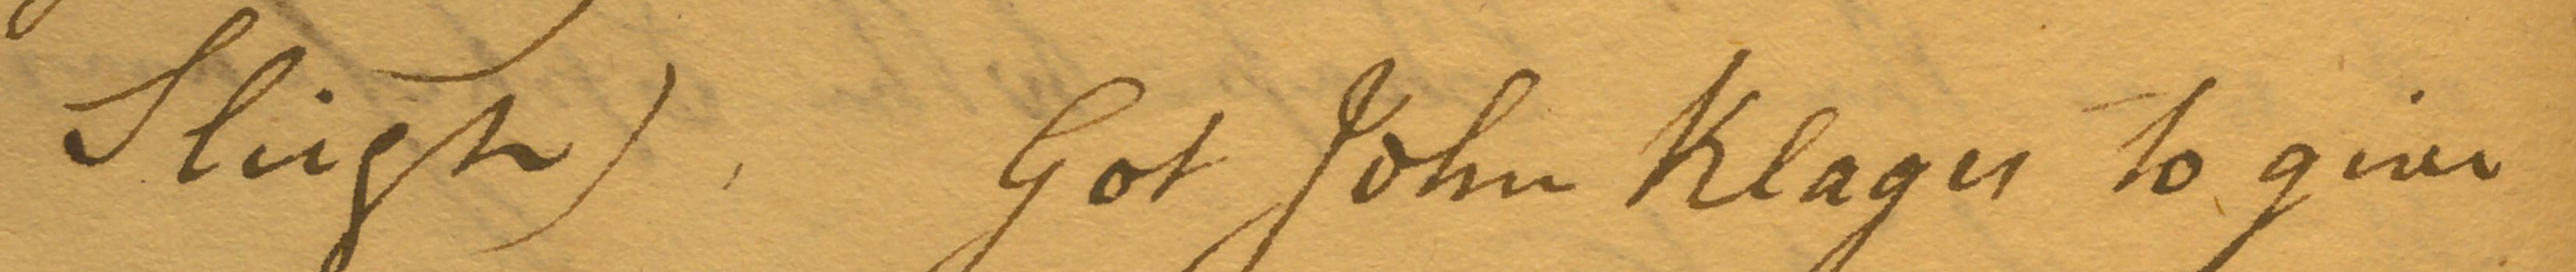Sleigh) Got John Klages to give
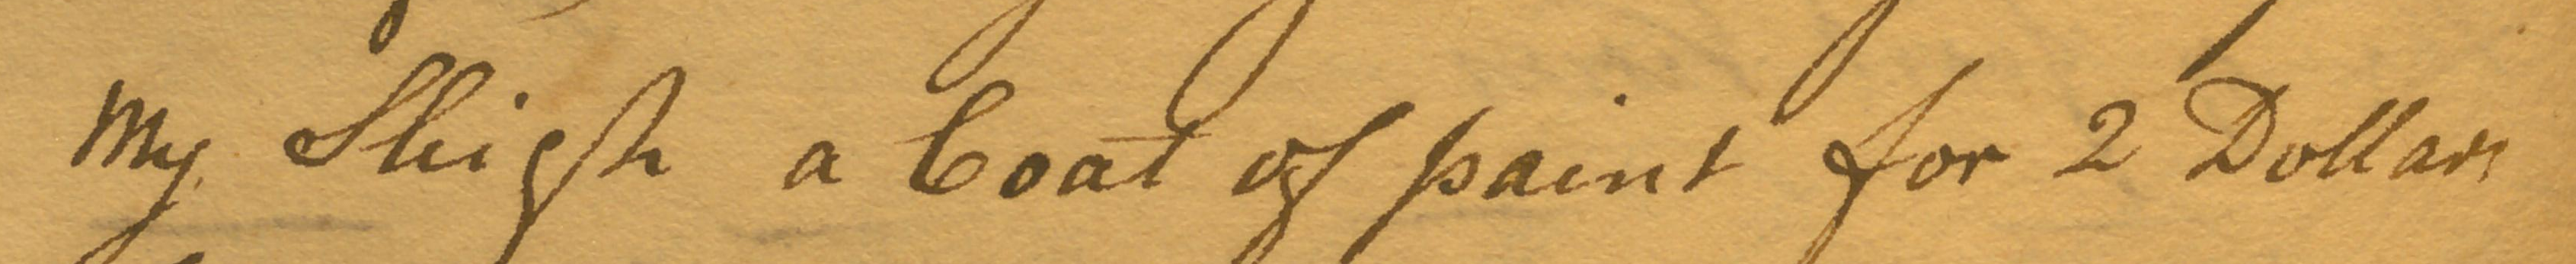My Sleigh a Coat of paint for 2 Dollars
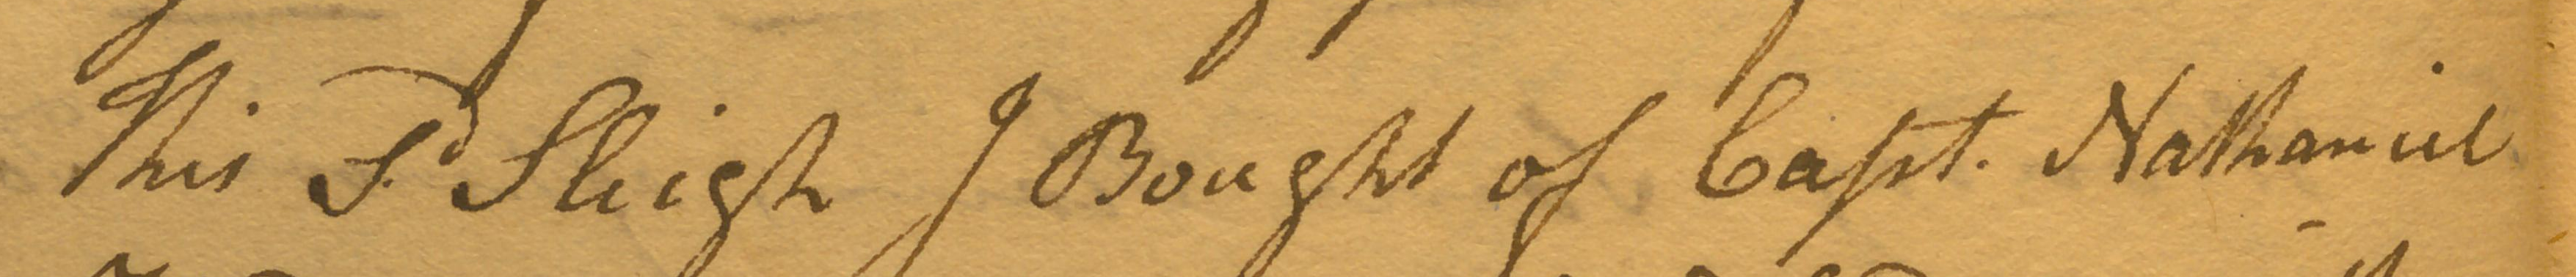This S^d. Sleigh I Bought of Capt. Nathaniel
